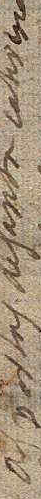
as portas de santa caterina
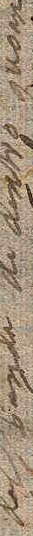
da banda de dentro quoan
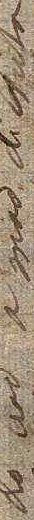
do uaõ a maõ direita
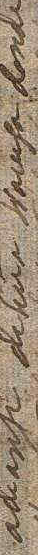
adiante de hūa trauesa, donde
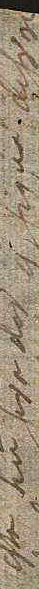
esta hū ferador q̄ fiqua defrn
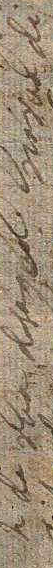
te da rua do saquo na rua di
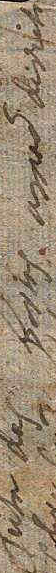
reita das portas a maõ direita
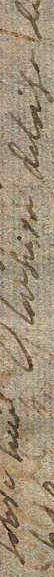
sobre huā louseira de loisa de
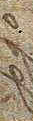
fogo
